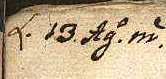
L. 13 Ag.o m.e
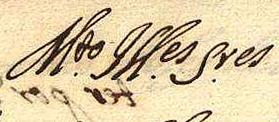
M.to Ill.es S.res
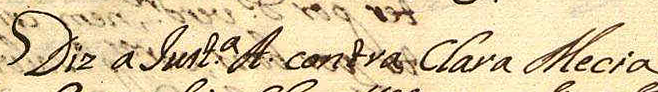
Diz a Iust.a A. contra Clara Mecia
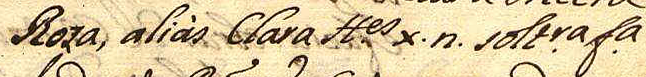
Roza, aliás Clara H.es x. n. solt.ra f.a
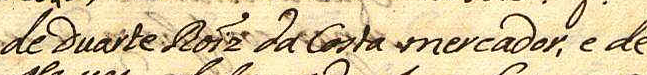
de Duarte Roīz da Costa mercador, e de
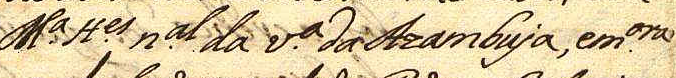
M.a H.es n.al da v.a da Azambuja, e m.ora
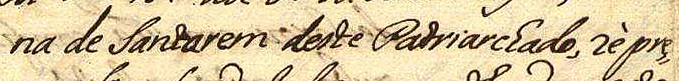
na de Santarem deste Patriarchado, ré pre
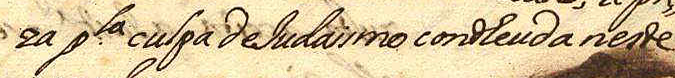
za p.la culpa de Iudaismo contheuda neste
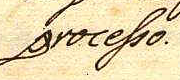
processo.
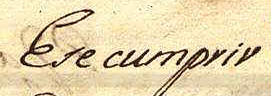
E se cumprir
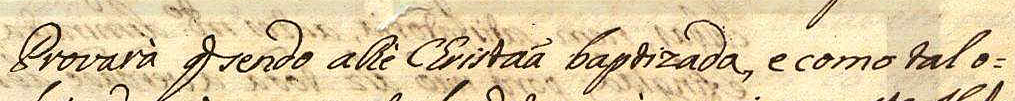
Provará q̄ sendo a Ré Christaã baptizada, e como tal o
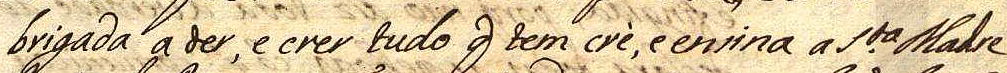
brigada a ter, e crer tudo q̄ tem cré, e ensina a s.ta Madre
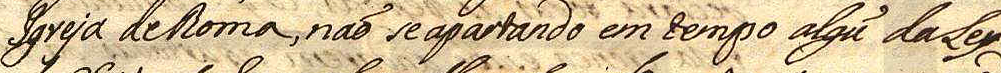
Igreja de Roma, naõ se apartando em tempo algū da Ley
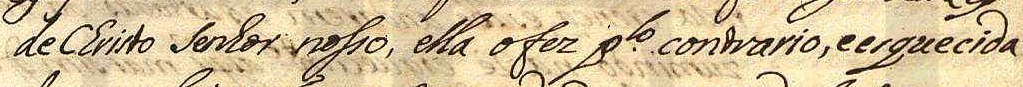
de Christo Senhor nosso, ella o fez p.lo contrario, e esquecida
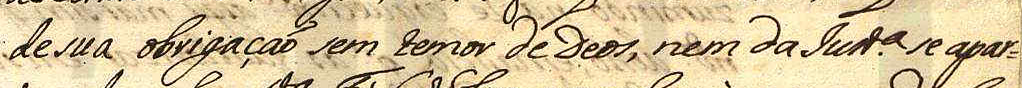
de sua obrigaçaõ sem temor de Deos, nem da Iust.a se apar
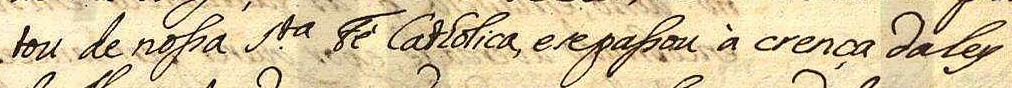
tou de nossa St.a Fé Catholica, e se passou á crença da Ley
